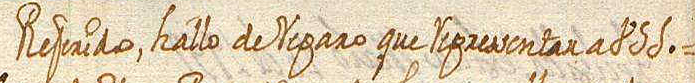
Referido, hállo de Reparo que Repressentan a VSI.
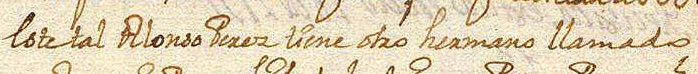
Este tal Alonso Perez tiene otro hermano llamado
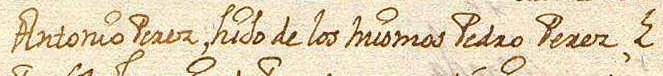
Antonio Perez, hijo de los mismos Pedro Perez, Y
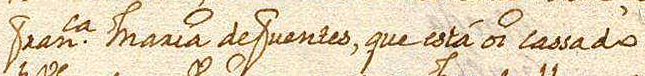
fran.ca Maria de fuentes, que está oi cassado
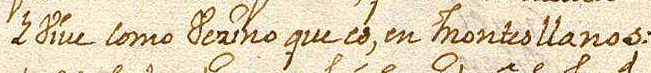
Y Viue como Vezino que es, en Montesllanos:
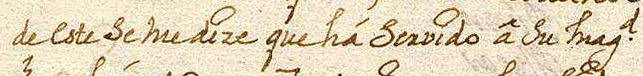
de Este Se me dize que há Servido â su Mag.d
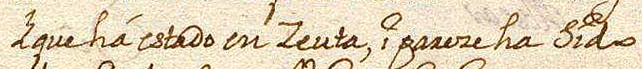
Y que há estado en Zeuta, i pareze ha Sido
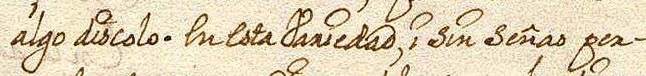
algo discolo. En esta Variedad, i sin señas per
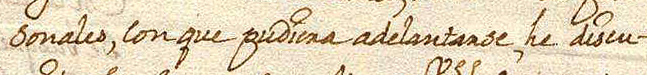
sonales, con que pudiera adelantarse, he discu
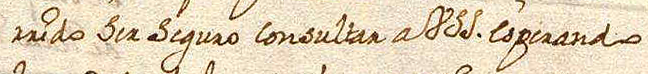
rrido Ser Seguro consultar a VSI. Esperando
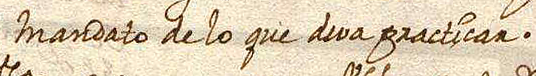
mandato de lo que deva practicar.
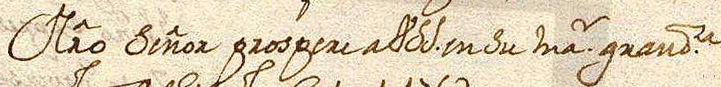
Nr̄o Señor prospere a VSI. en Su ma.r grand.za
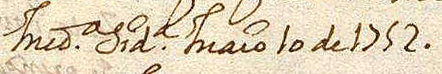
Med.a Sid.a Maio 10 de 1752.
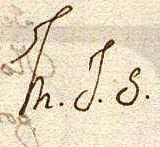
M. I. S.
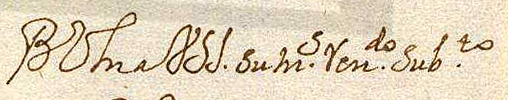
B l Ma V SI. Su m.s Reu.do Sub.to
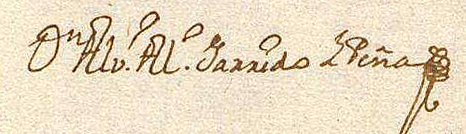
Dn Alv.o Al.o Garrido Y Peña
